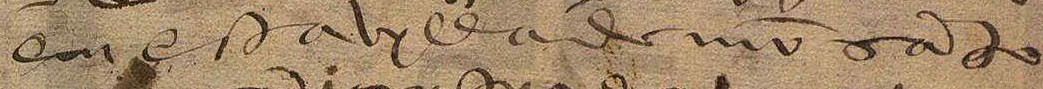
em esta vylla de mōsāto
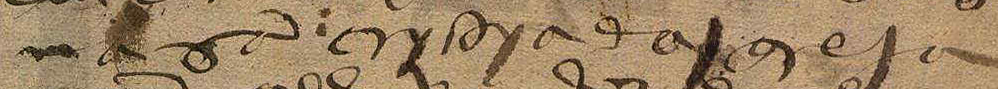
na sācrystya da JgreJa
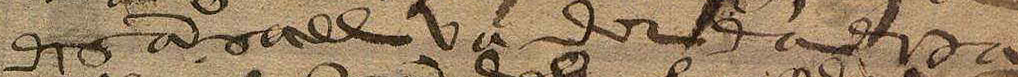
de sā sallvador da dita
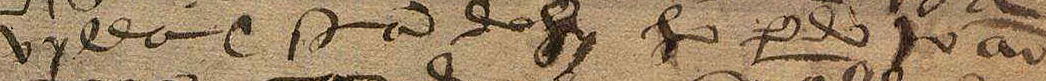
vylla estādo hy ho Ldo João
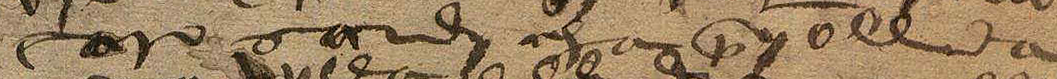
caro sardjnha p̄yoll da
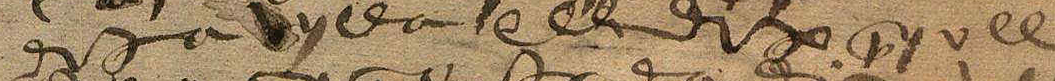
dita vylla elle dito p̄yoll
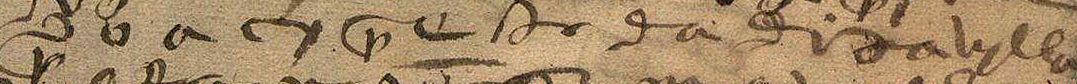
p̄o acyp̄este da dita vylla
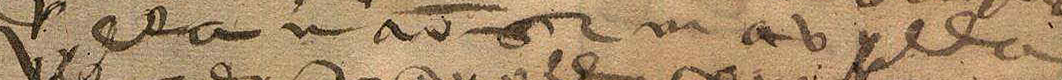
vylla naõ ser na vylla
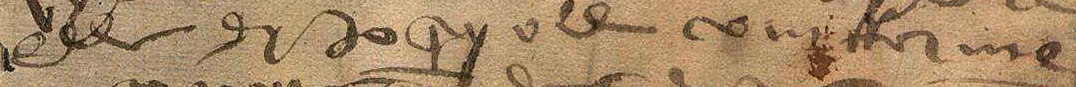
elle dyto p̄yoll comfforme
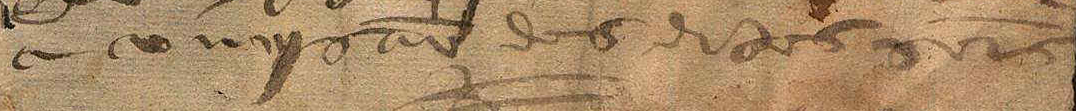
a comysão dos ditos sor̄s
